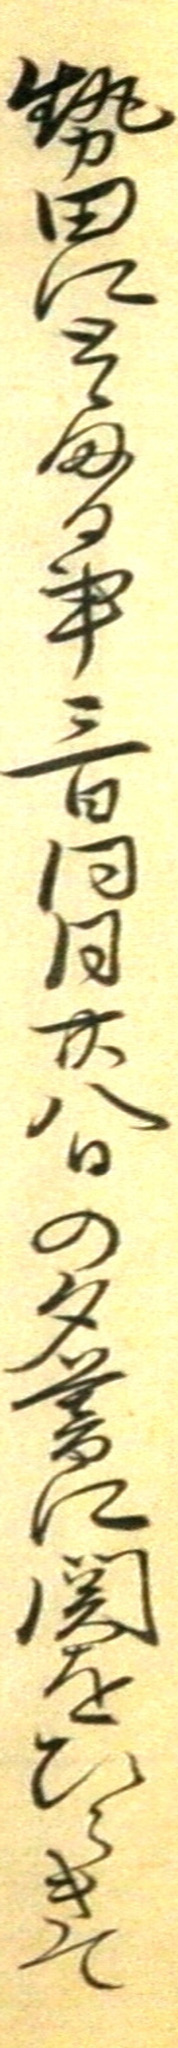勢田にとゝまる事三日同月廿八日の夕暮に関をひらきて
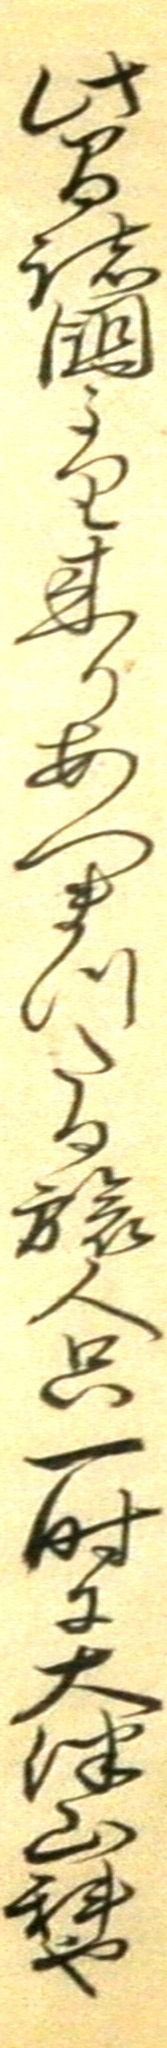此間諸国より来りあつまつたる旅人只一時に大津山科や
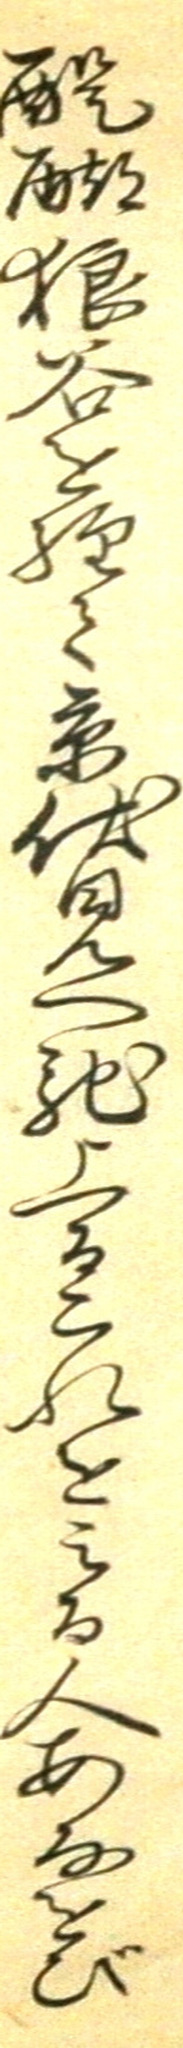醍醐狼谷を経て京伏見へ馳上るこれをみる人あなをび
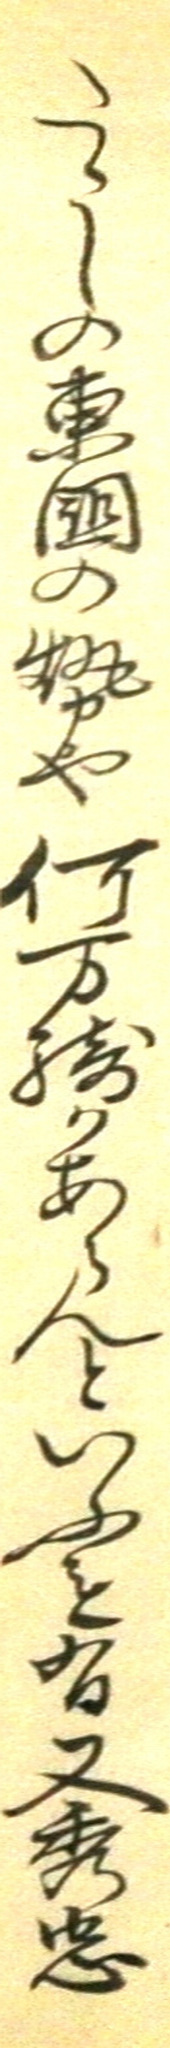たゝしの東国の勢や何万騎かあらんといふも有又秀忠
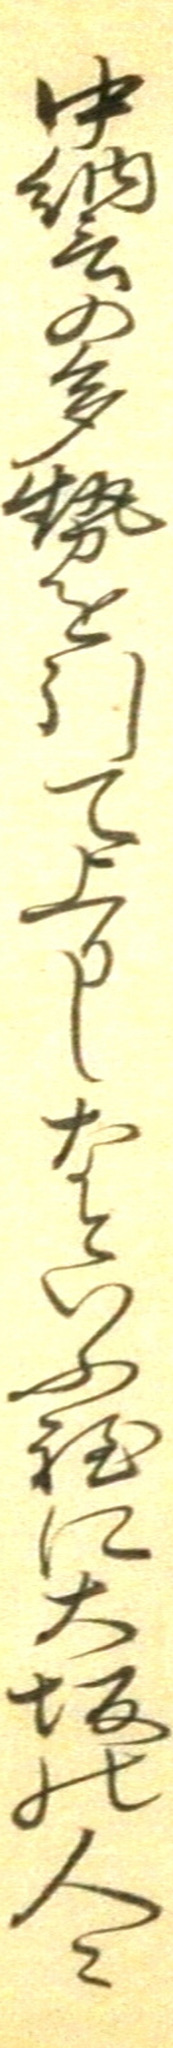中納言の多勢を引て上りしなといふ程に大坂の人々
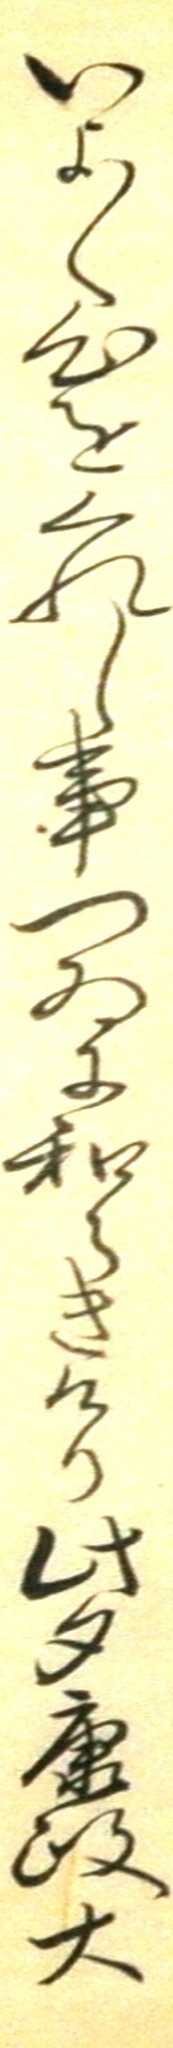いよ〳〵心をくれし事つゐに和らきけり此夕康政大
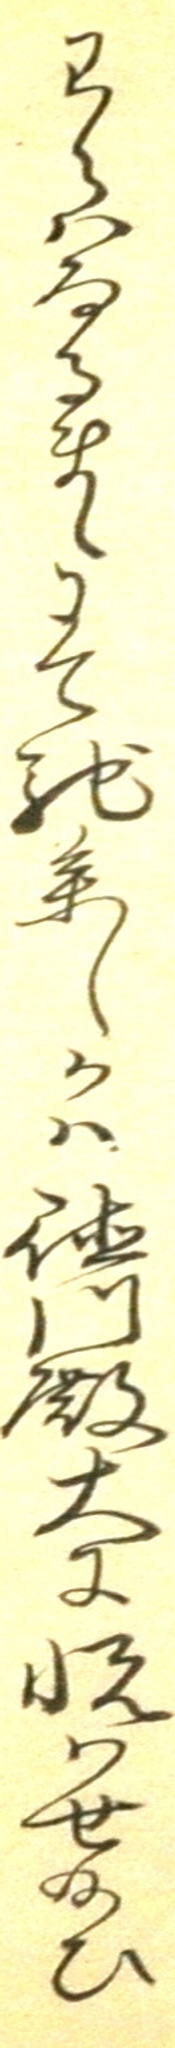わらはなるまゝにて馳参しかは徳川殿大に悦わせ給ひ
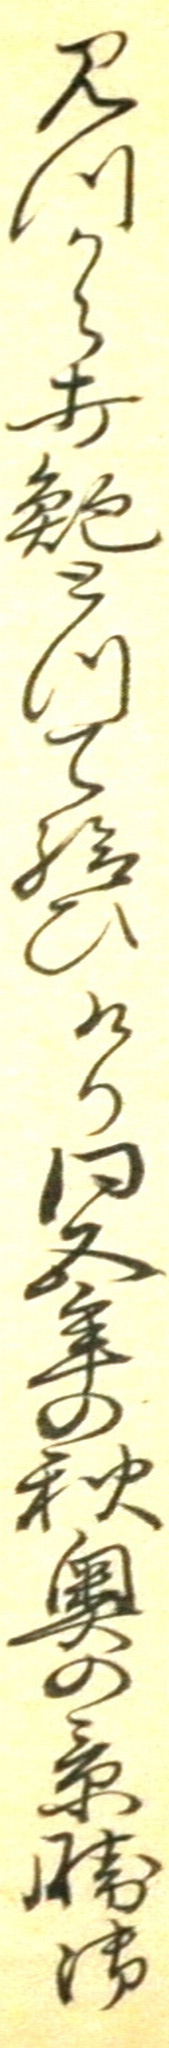みつから打鮑とつて給ひけり同五年の秋奥の景勝御
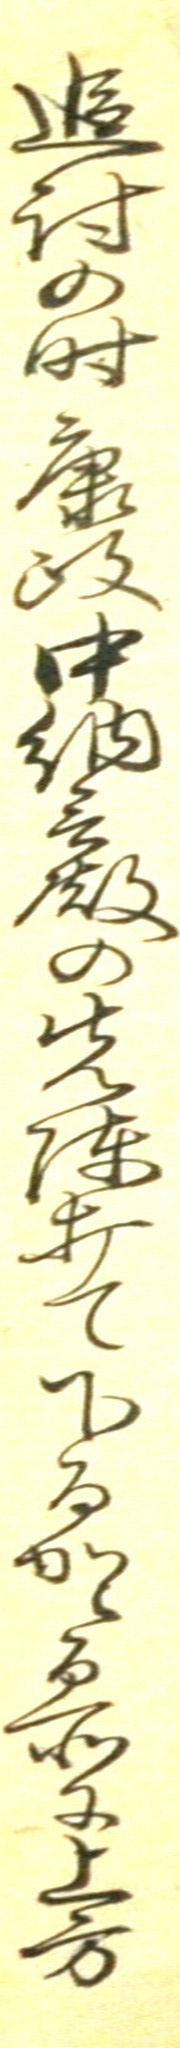追討の時康政中納言殿の先陣打て下るかゝる所に上方
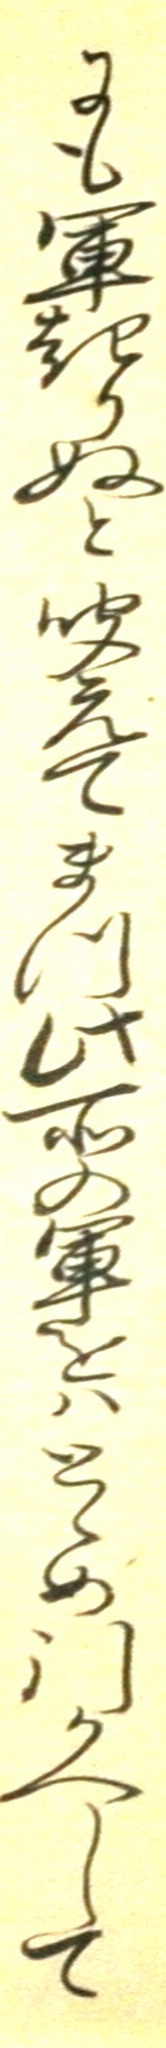にも軍起りぬと聞えてまつ此所の軍をはとゝめ引かへして
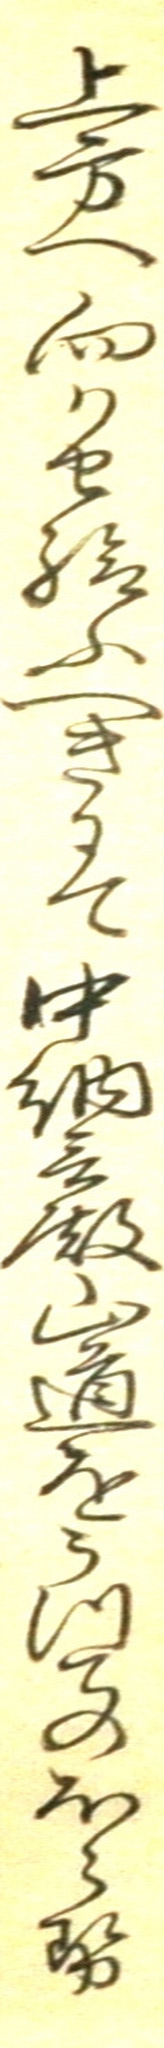上方へ向はせ給ふへきにて中納言殿山道をうつてのほらせ
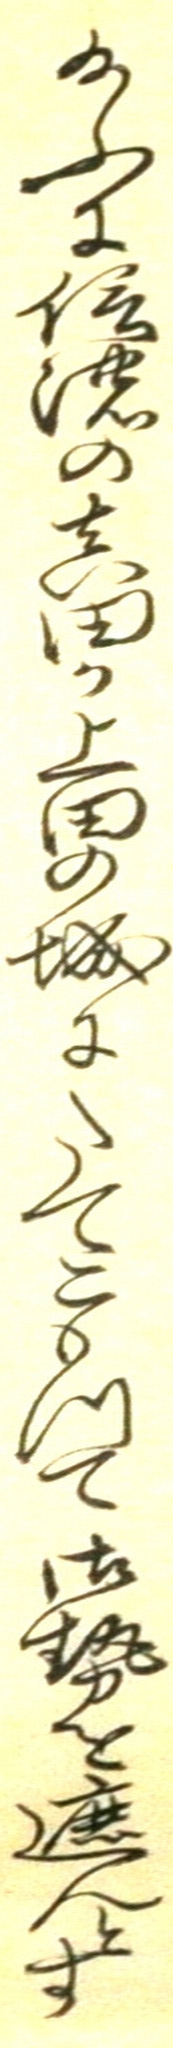給ふに信濃の真田か上田の城にたてこもつて御勢を遮んとす
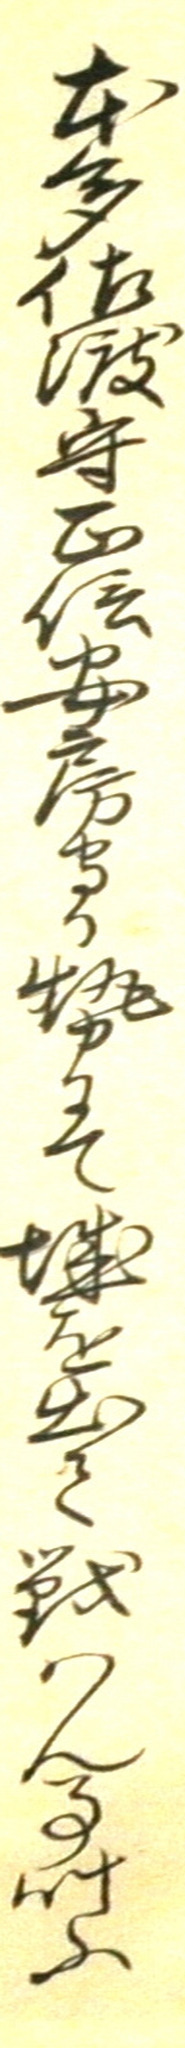本多佐渡守正信安房守か勢にて城を出て戦はん事叶ふ
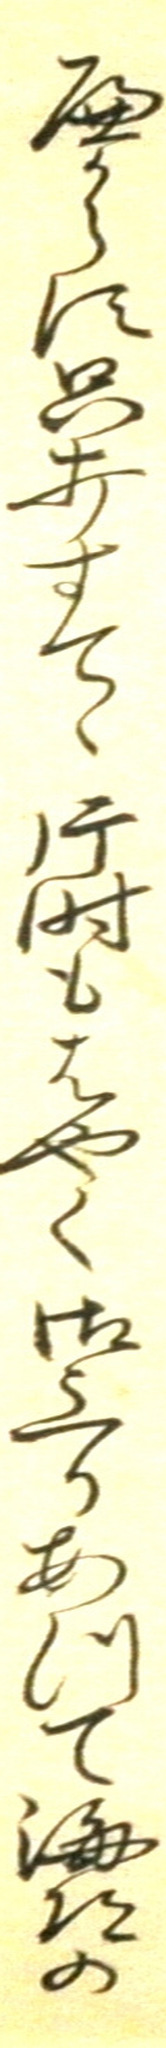へからす只打すてゝ片時もはやく御上りあつて海道の
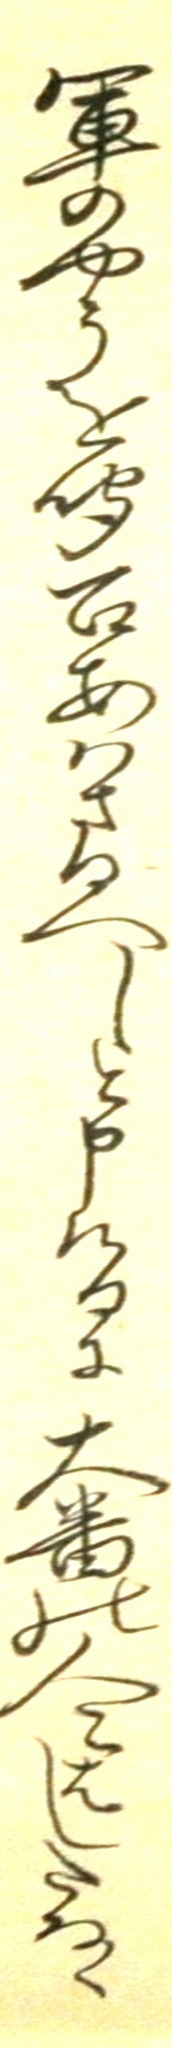軍のやうを聞召あはさるへしと申けるに大番の人々はしたなく
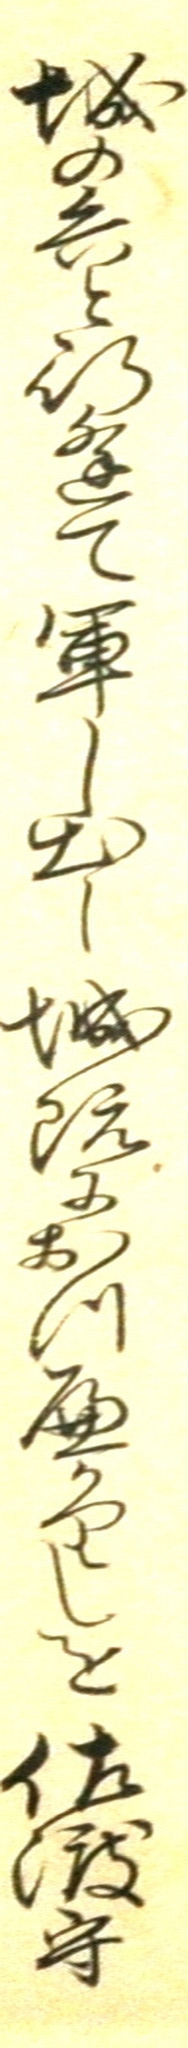城の兵と行逢て軍し出し城既におつへかりしを佐渡守
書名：藩翰譜（四・上）
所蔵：伊那市立高遠町図書館・合同会社AMANE
